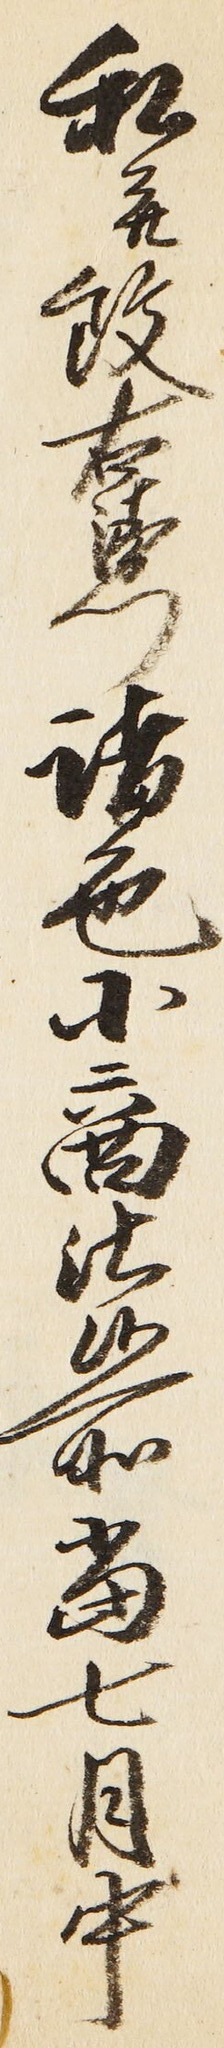私并政右衛門諸色小商仕候所当七月中
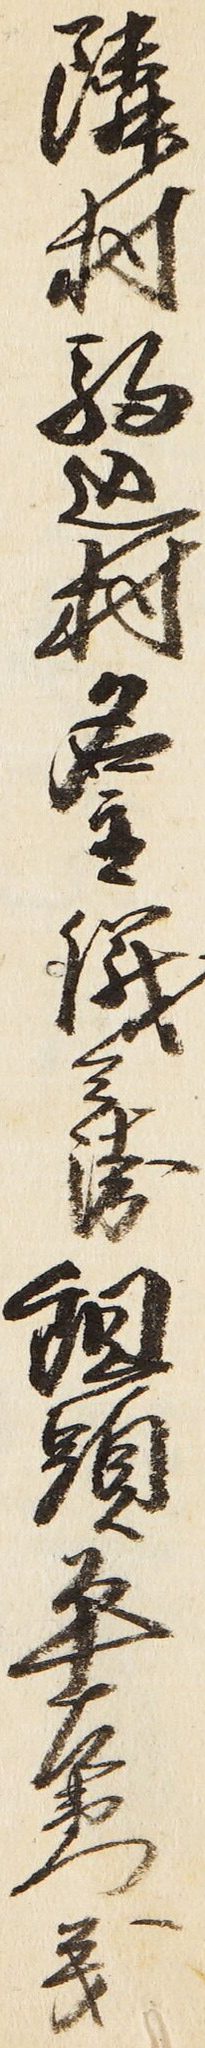隣村駒込村名主儀兵衛組頭平左衛門義
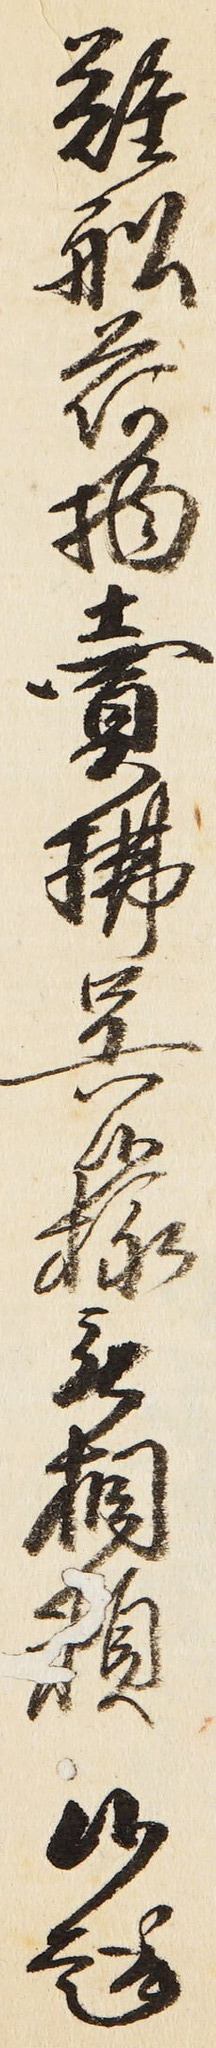難船荷物売払呉候様被相頼候趣
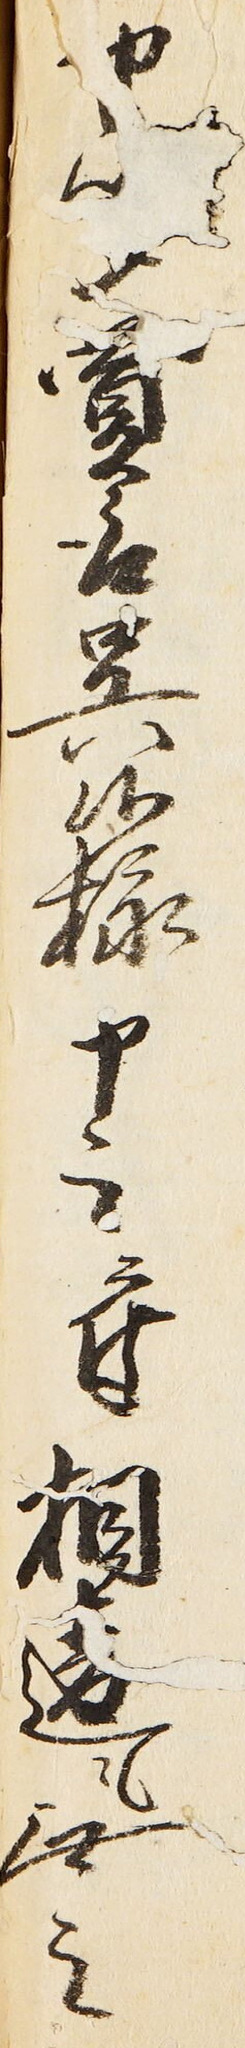申買取呉候様申之ニ付相違も無之
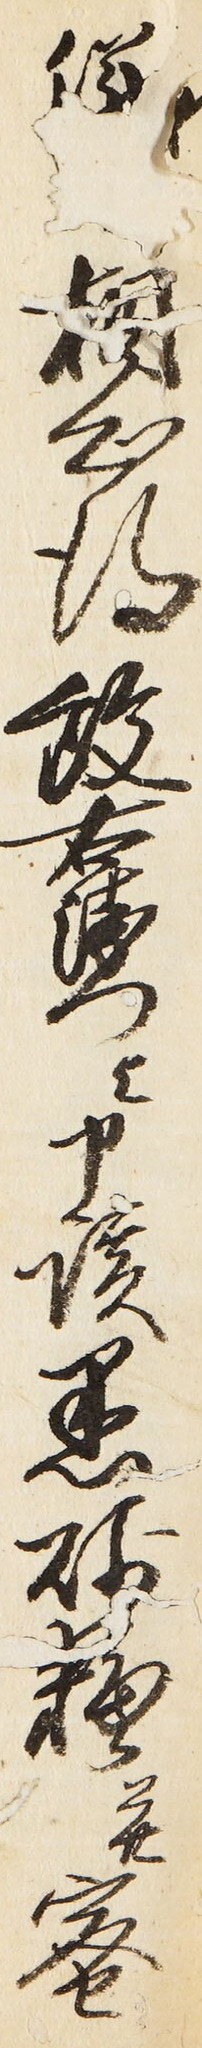儀相心得政右衛門与申談黒砂糖并蜜
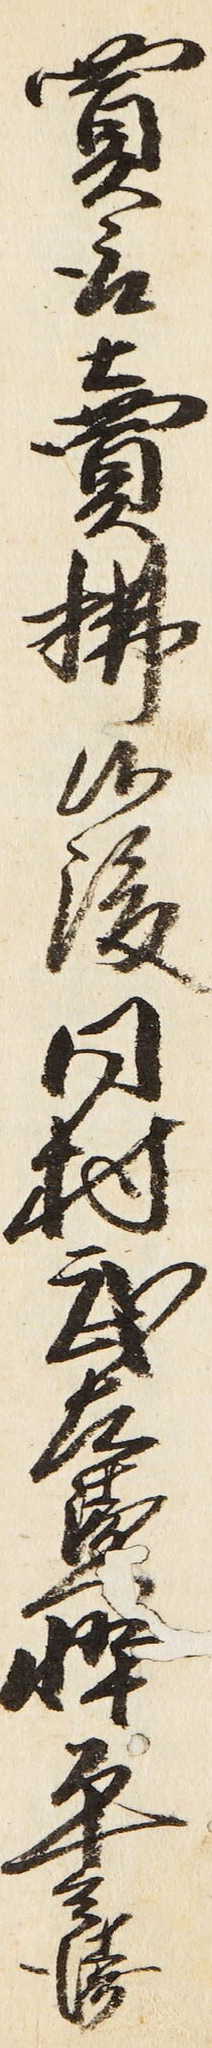買取売払候後同村武左衛門忰平兵衛
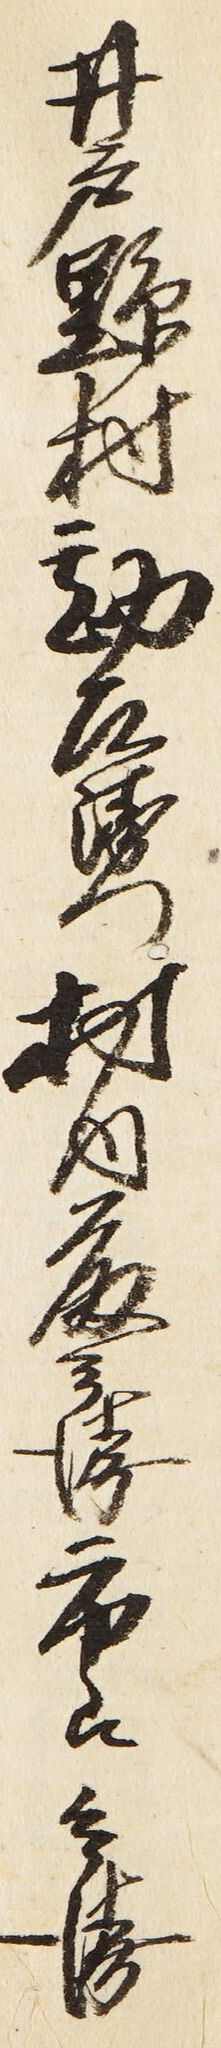井戸野村勘左衛門村内藤兵衛市郎兵衛
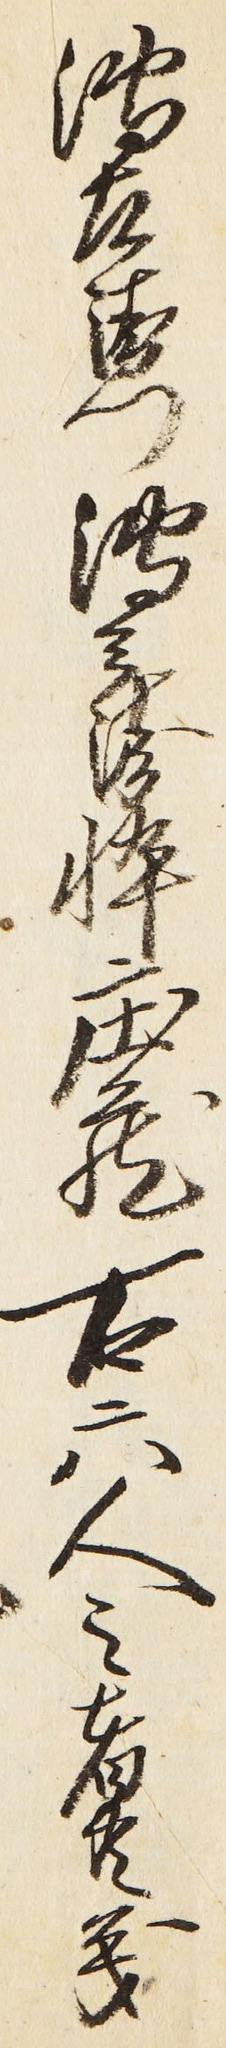伝左衛門伝兵衛忰庄蔵右六人之者共義
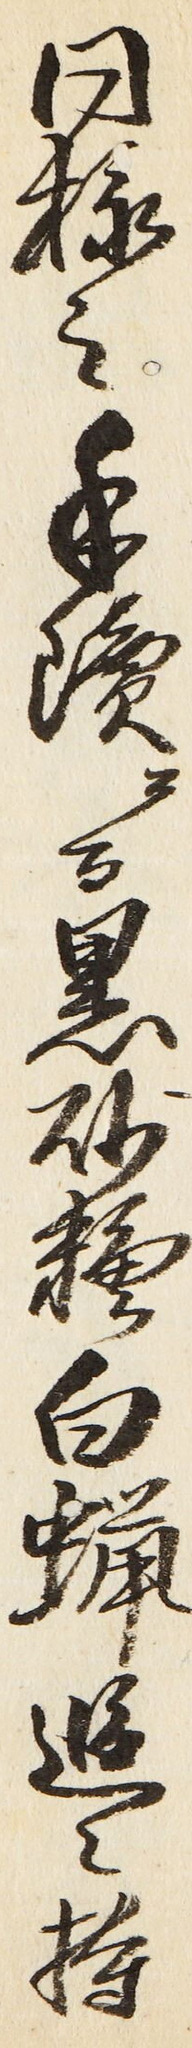同様之手続ニ而黒砂糖白蝋追々持
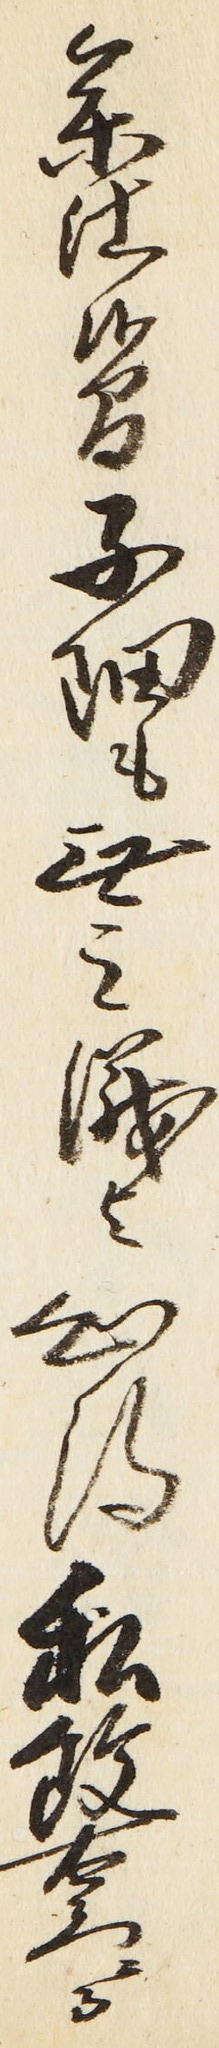参資仕候間子細も無之儀与心得私政右衛門ニ而
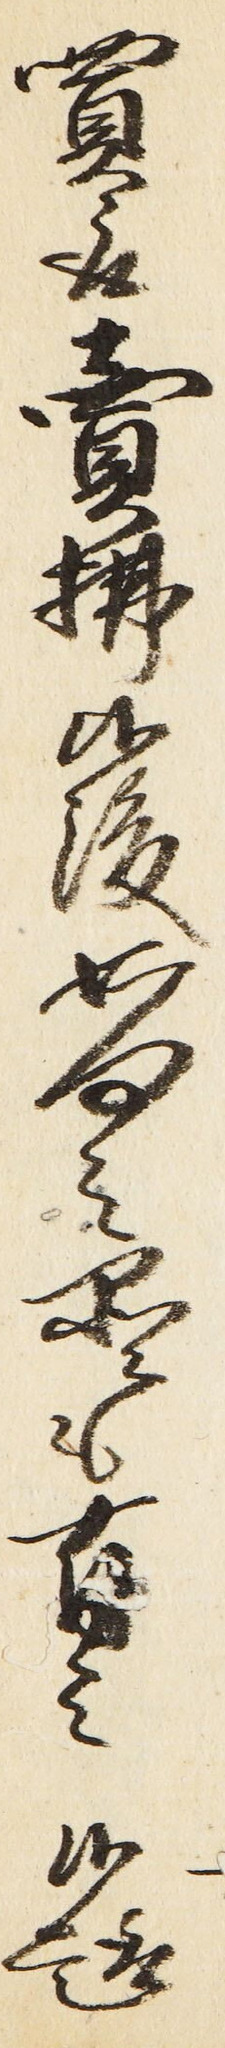買取売払候後如何之品ニも有之候趣

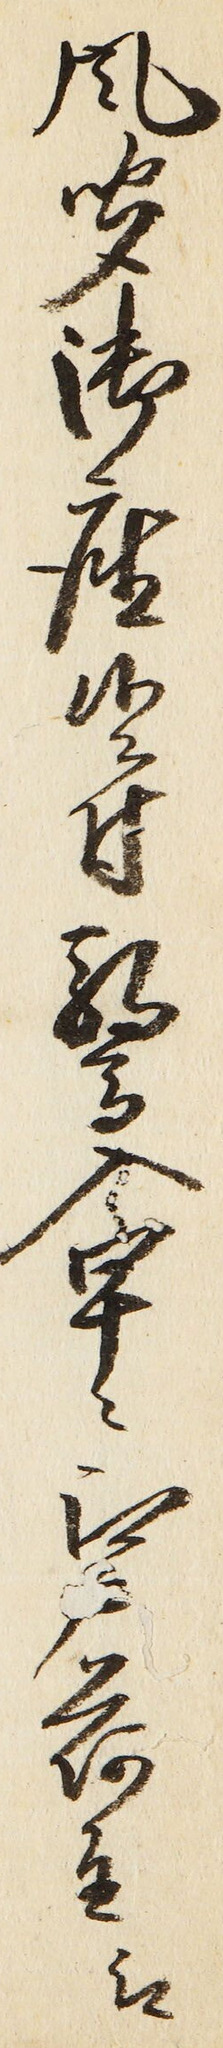風聞御座候ニ付驚入早々ニ江戸荷主江
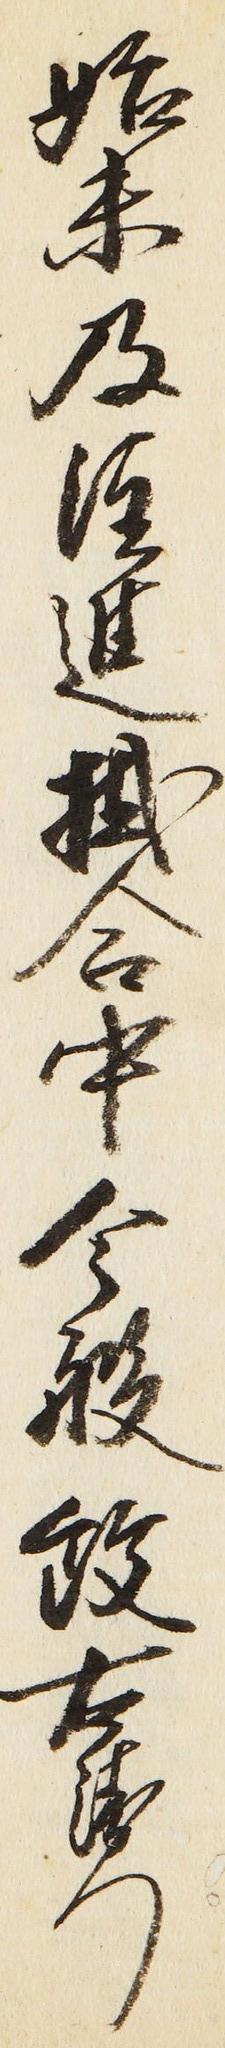始末及注進掛合中今般政右衛門
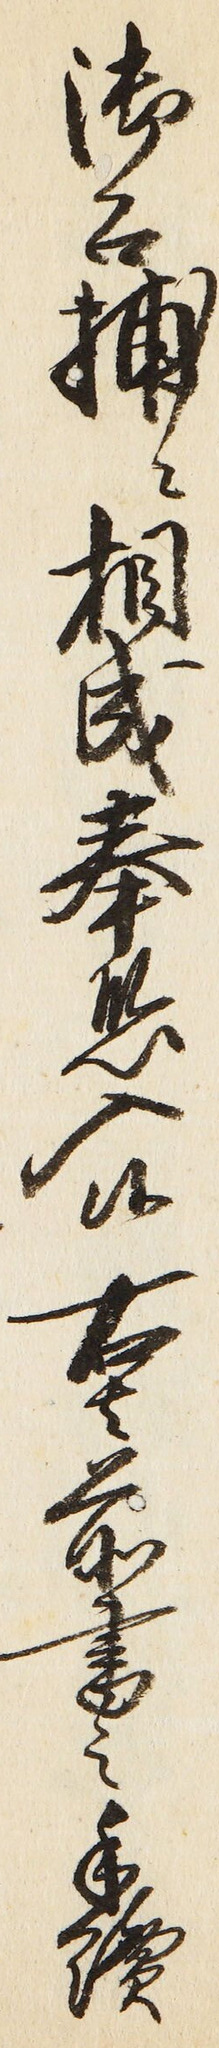御召捕ニ相成奉恐入候右者前書之手続
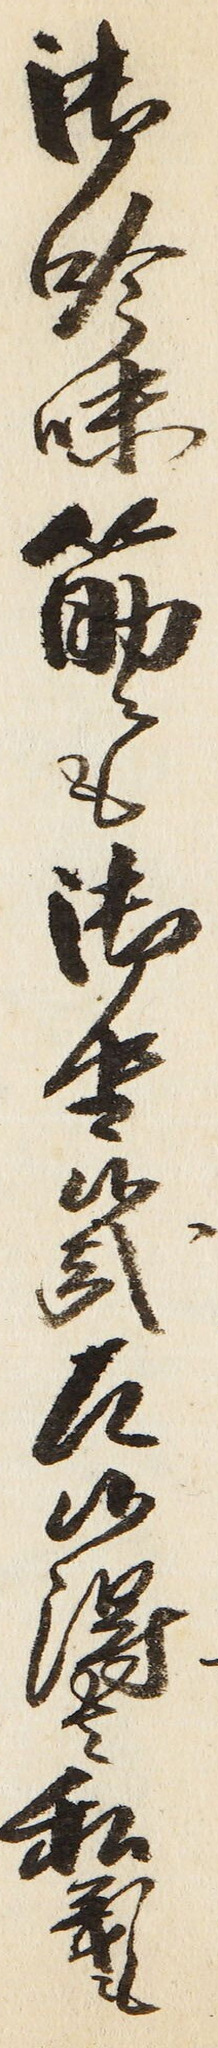御吟味筋ニも御座候哉左候得者私義も
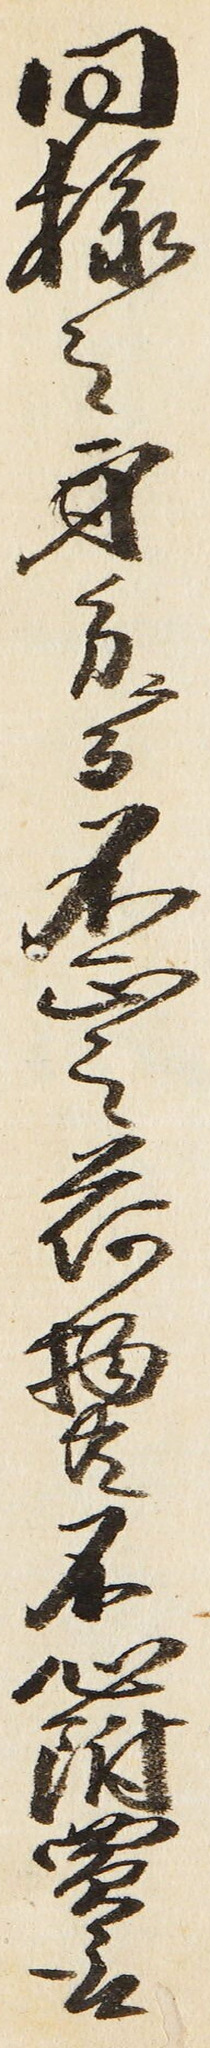同様之身方ニ而不正之荷物共不心付買取
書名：難船一件記録
